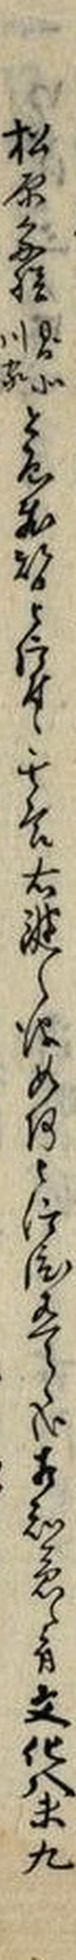松原多膳則北川家と屋敷替被仰付候其節右鍵之儀如何被仰渡有之候哉相知兼候に付文化八未九
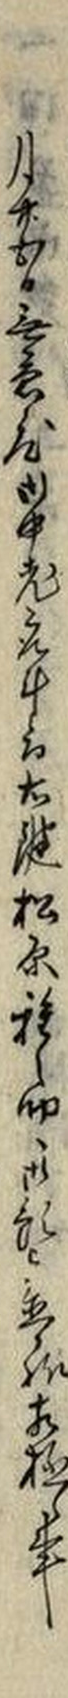月廿五日無急度御中老取斗に而右鍵松原権之助へ御預被置候様相極候事

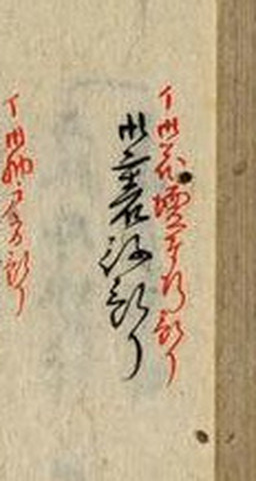御裏役預り
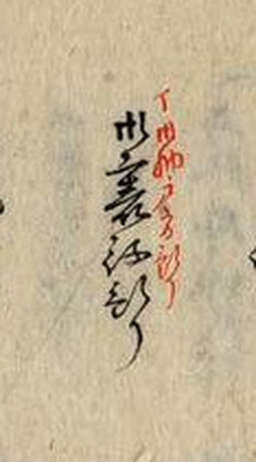御裏役預り
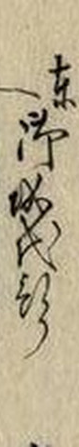御裏役預り
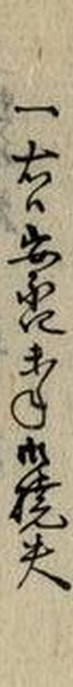一右は安永四未年御焼失
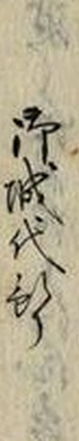御裏役預り
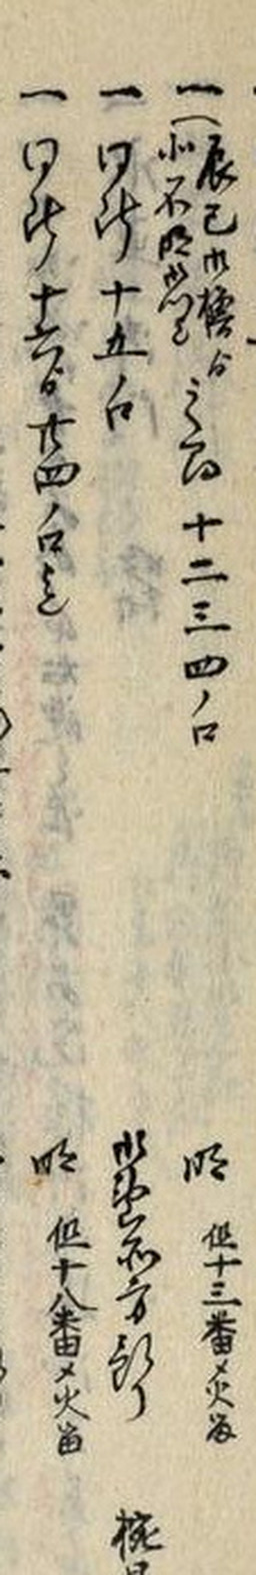一同断八ノ口御台所方預り
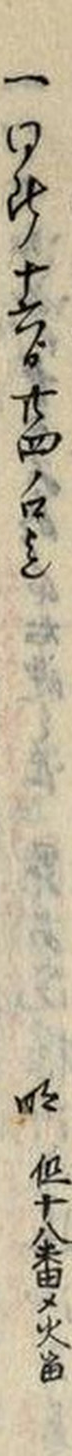一同断十六ゟ廿四ノ口迄明但十八番メ火留
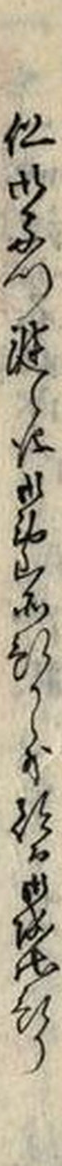但御多門鍵之儀御台所預り之外都而御城代預り
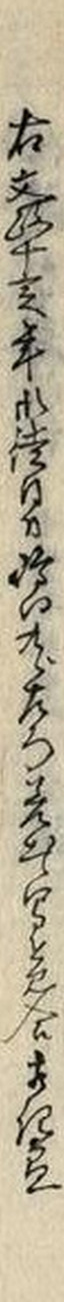右文政十亥年御徒目付嶋田九郎左衛門差出候写と見合相記置
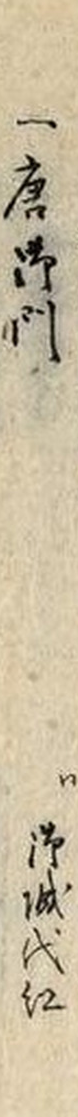一唐御門同御城組
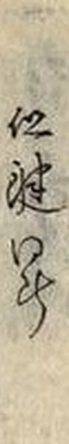但鍵同断
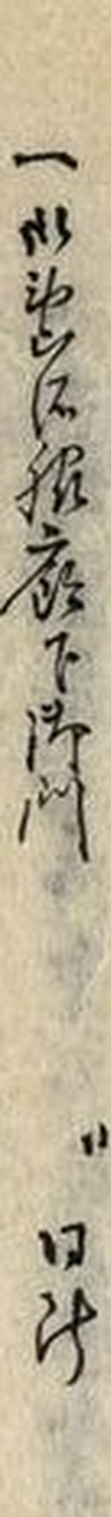一御台所脇廊下御門同同断
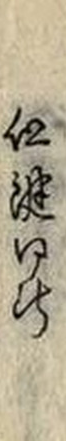但鍵同断
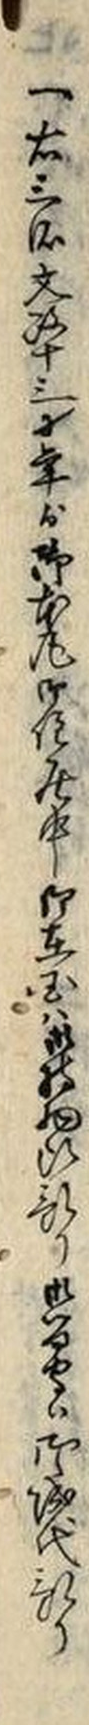一右三所文政十三寅年ゟ御本丸御住居中御在国は御持物頭預り御留守は御城代預り
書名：御門御櫓之部
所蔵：福井県文書館 Fukui Prefectural Archives
